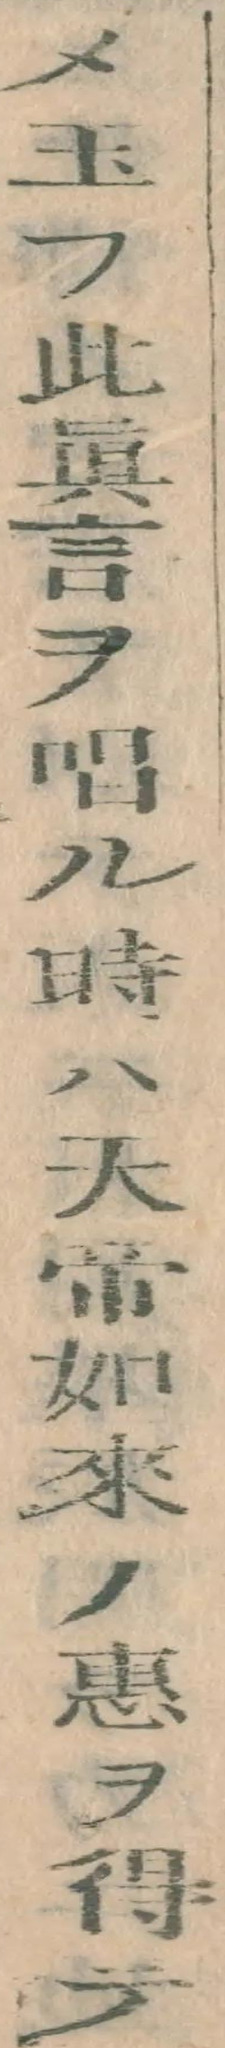メ玉フ此真言ヲ唱ル時ハ天帝如来ノ恵ヲ得テ
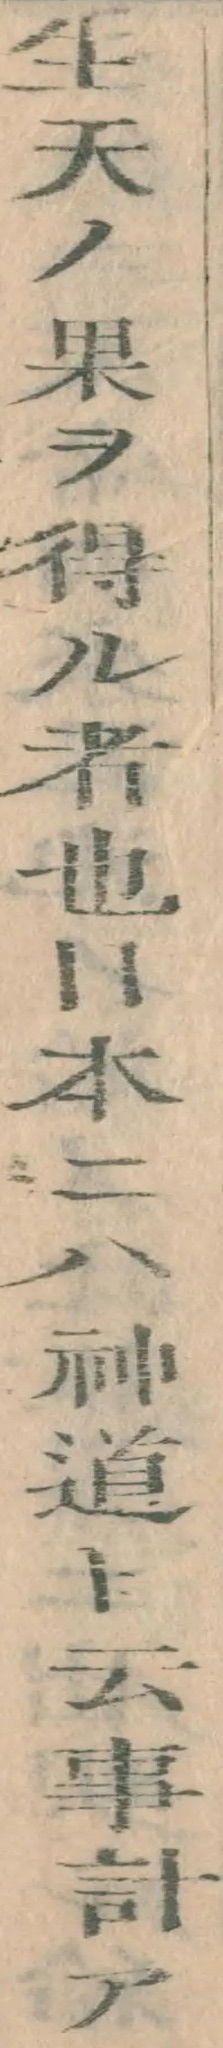生天ノ果ヲ得ル者也日本ニハ神道ト云事計ア
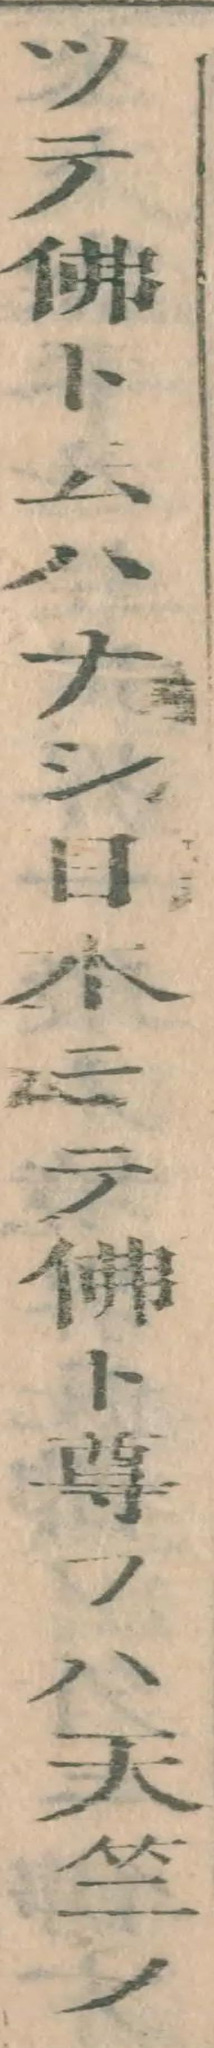ツテ仏ト云ハナシ日本ニテ仏ト尊フハ天竺ノ
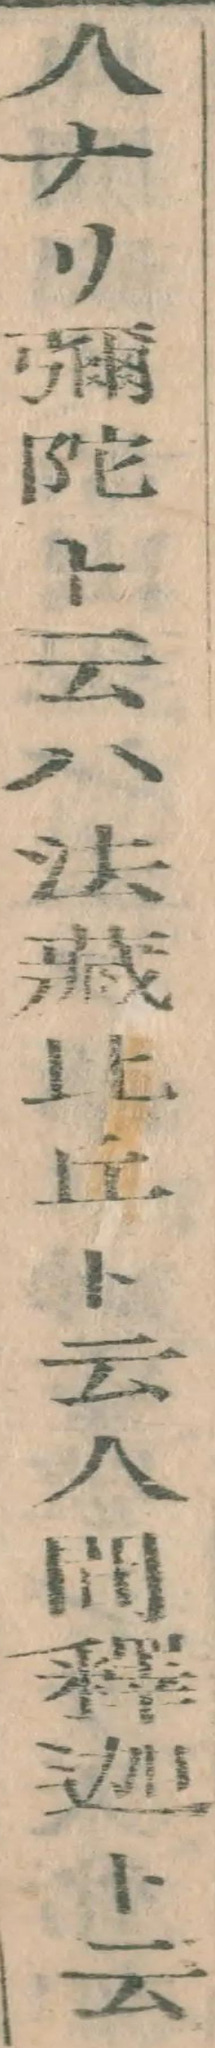人ナリ弥陀ト云ハ法蔵比丘ト云人間釈迦ト云
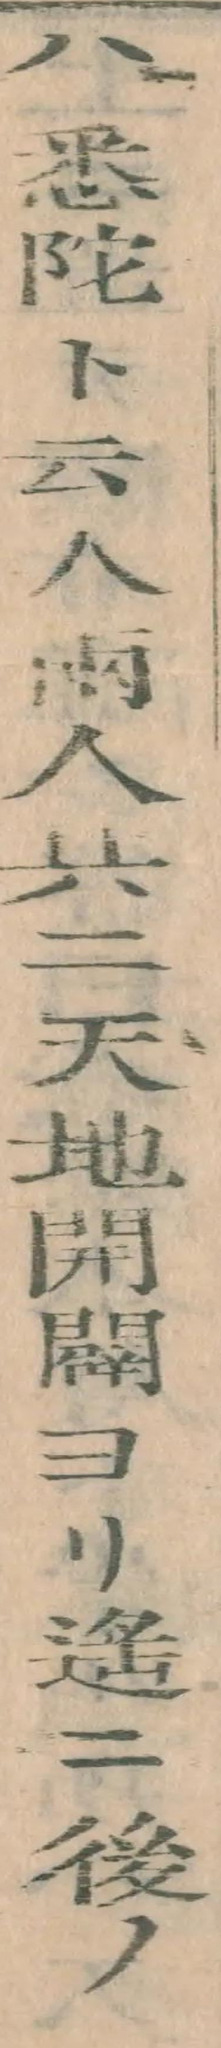ハ悉陀ト云人両人共ニ天地開闢ヨリ遥ニ後ノ
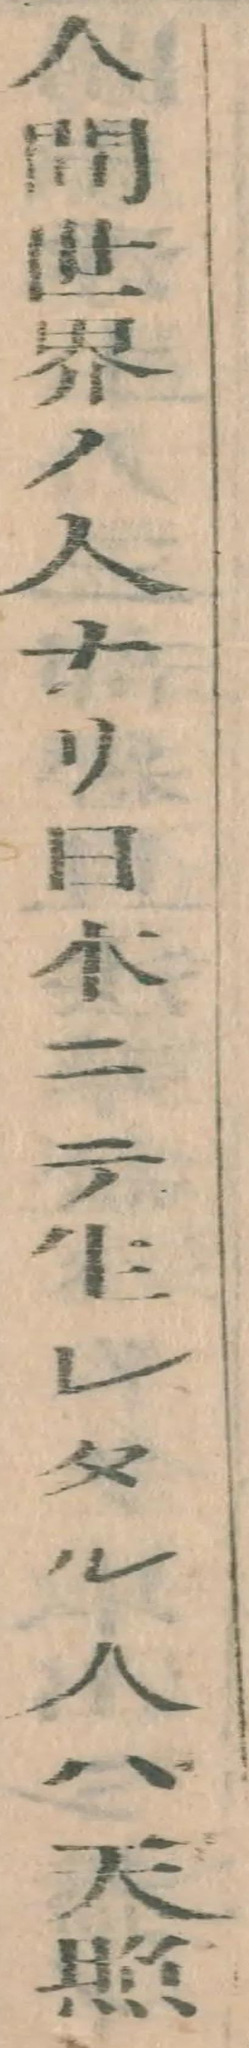人間世界ノ人ナリ日本ニテ生レタル人ハ天照
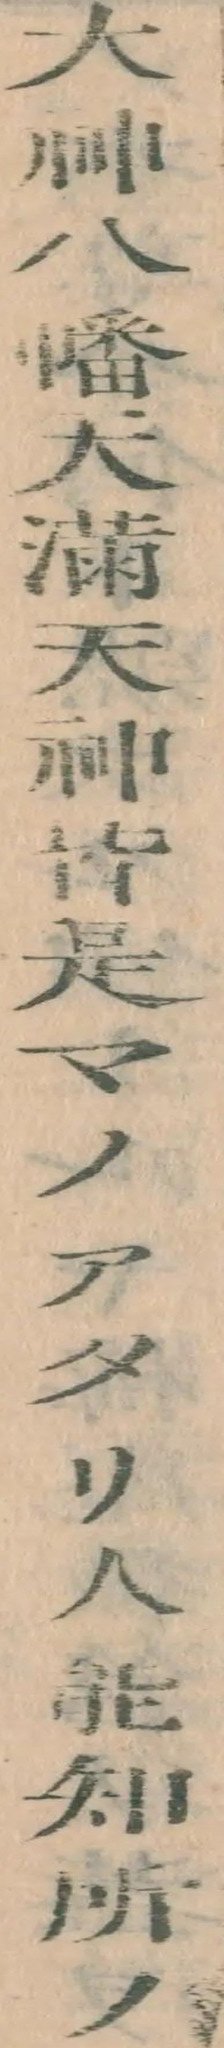大神八幡天満天神皆是マノアタリ人能知所ノ
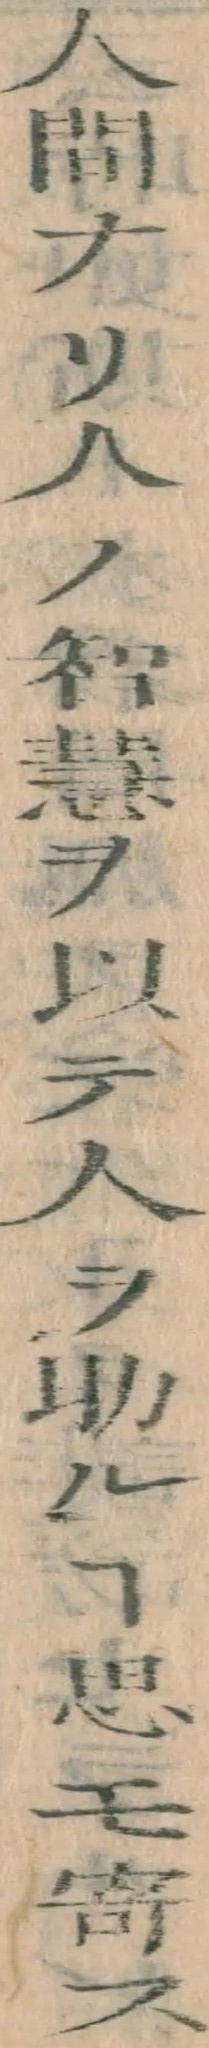人間ナリ人ノ智慧ヲ以テ人ヲ助ルヿ思モ寄ス
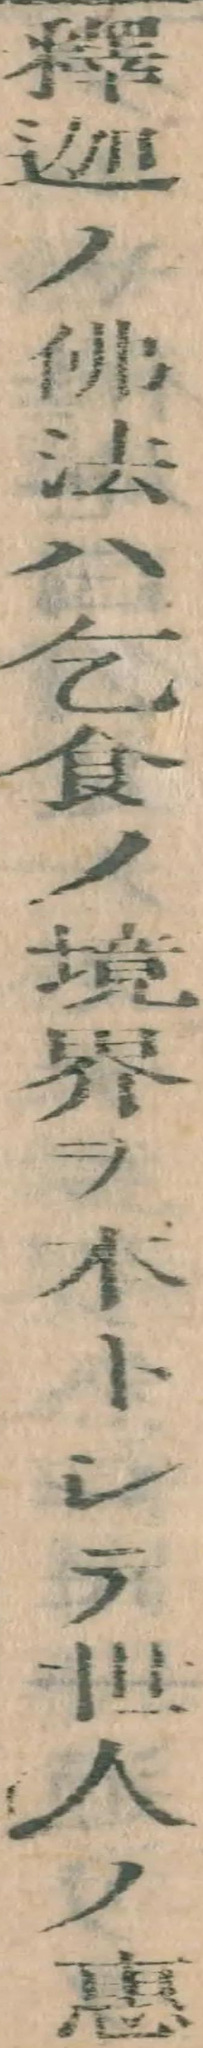釈迦ノ仏法ハ乞食ノ境界ヲ本トシテ世人ノ恵
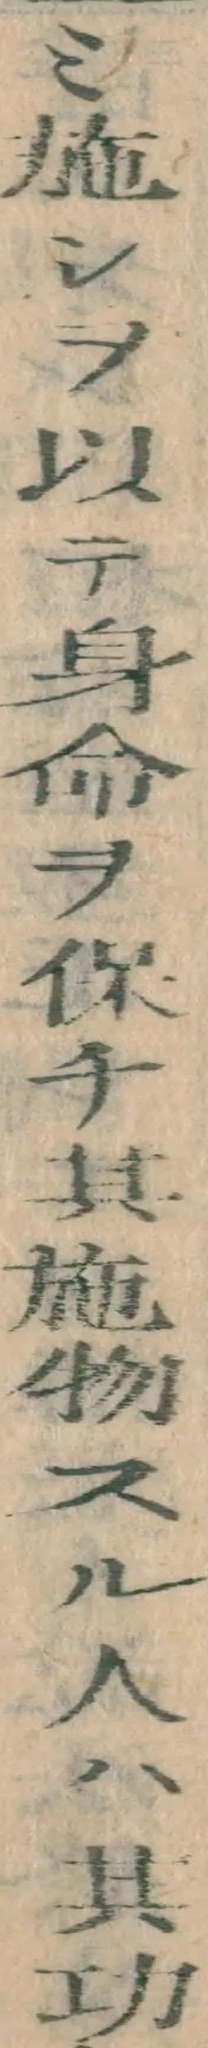ミ施シヲ以テ身命ヲ保チ其施物スル人ハ其功
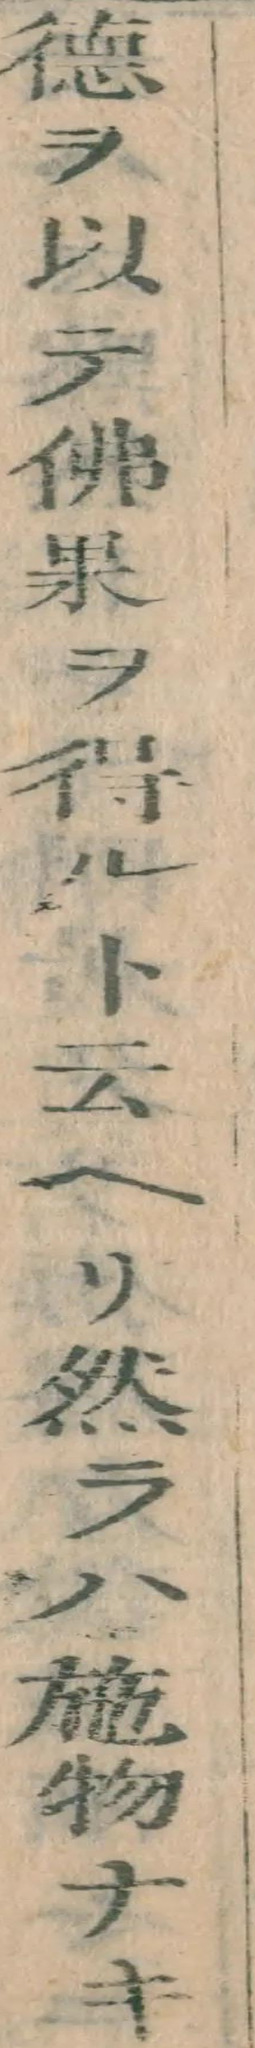徳ヲ以テ仏果ヲ得ルト云ヘリ然ラハ施物ナキ
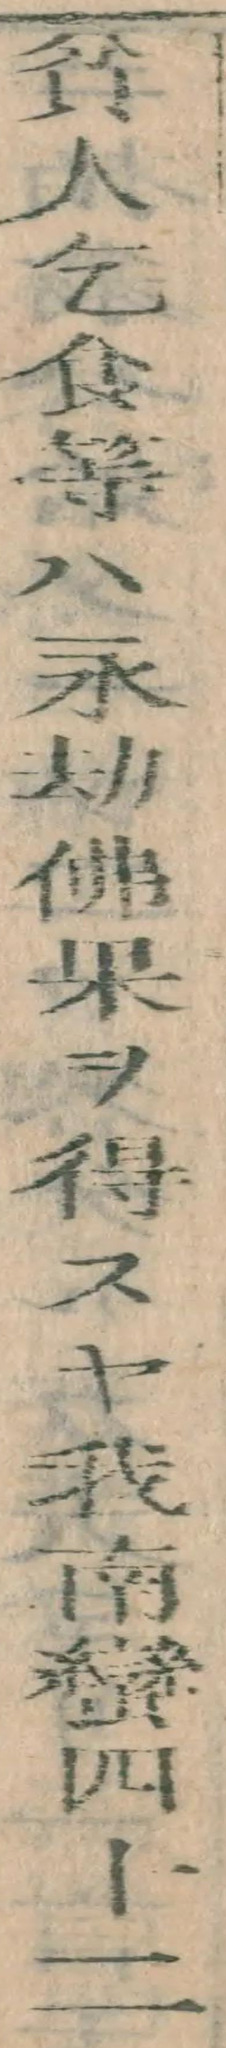貧人乞食等ハ永劫仏果ヲ得スヤ我南蛮四十二
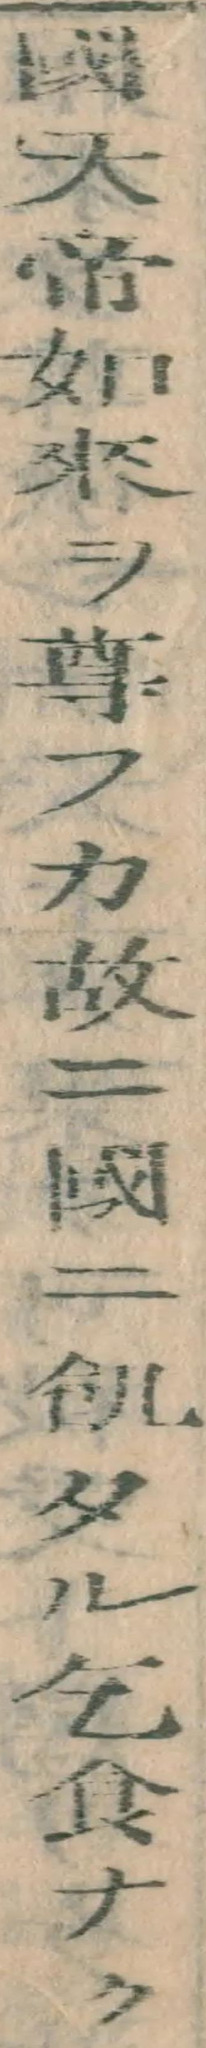国天帝如来ヲ尊フカ故ニ国ニ飢タル乞食ナク
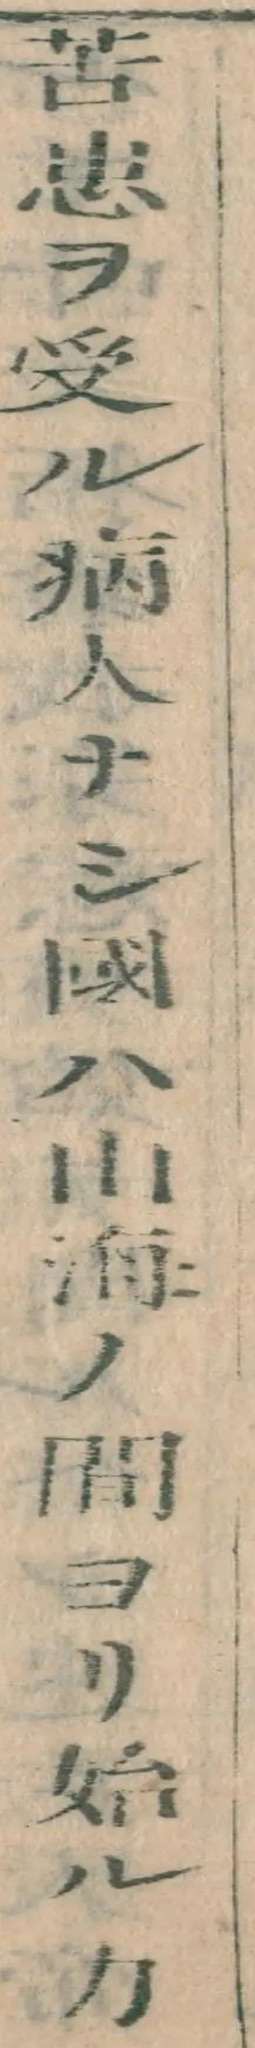苦患ヲ受ル病人ナシ国ハ山海ノ間ヨリ始ルカ
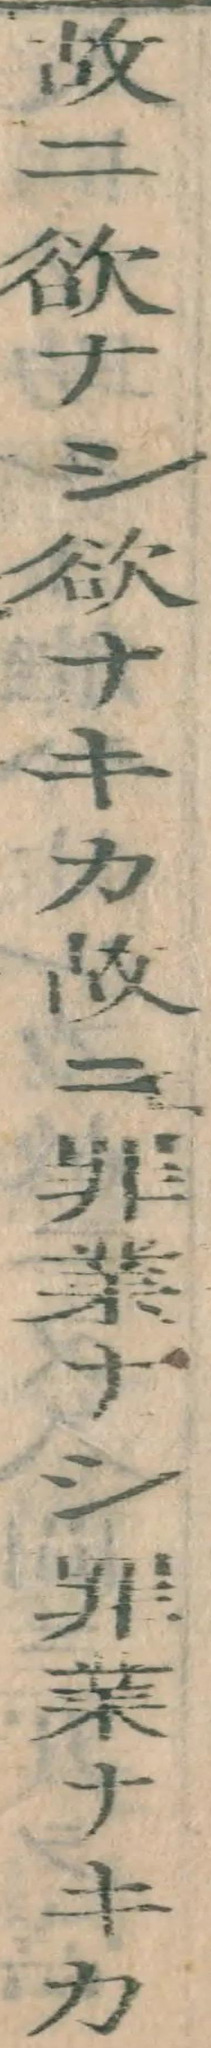故ニ欲ナシ欲ナキカ故ニ罪業ナシ罪業ナキカ
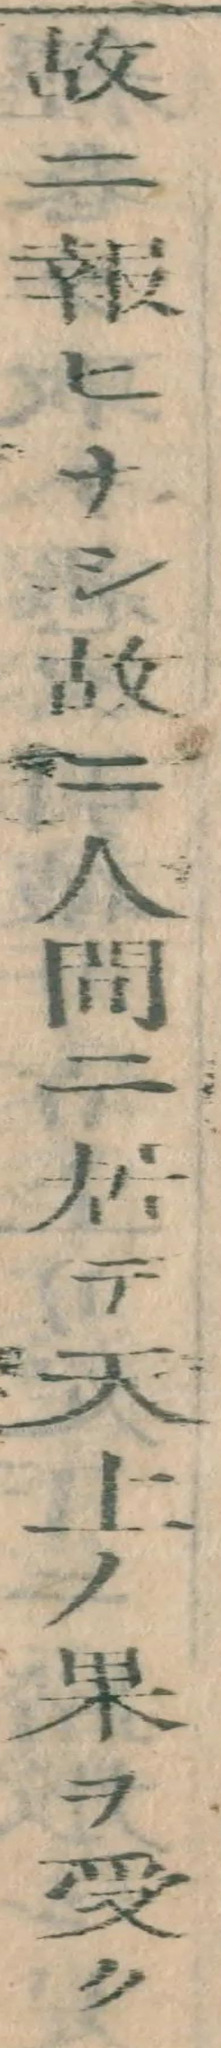故ニ報ヒナシ故ニ人間ニ居テ天上ノ果ヲ受ク
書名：南蛮寺興廃記
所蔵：国立国会図書館 National Diet Library, JAPAN
